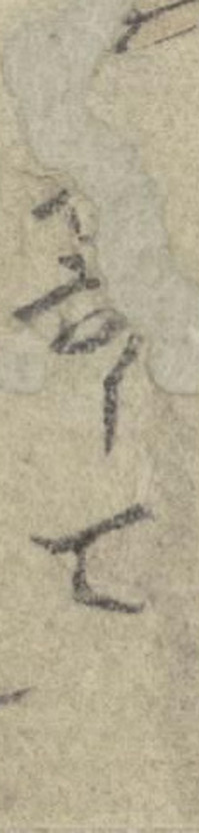なして
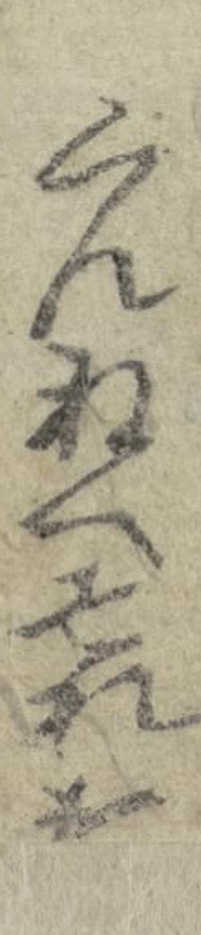くんねへそれ
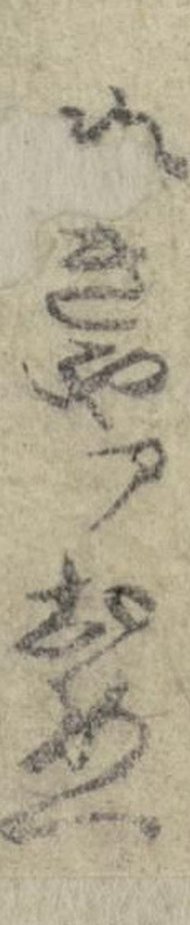きやァおめへ
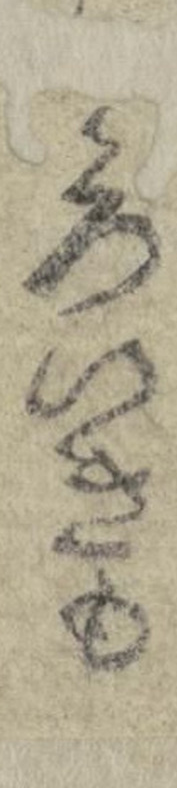ゝろいきも
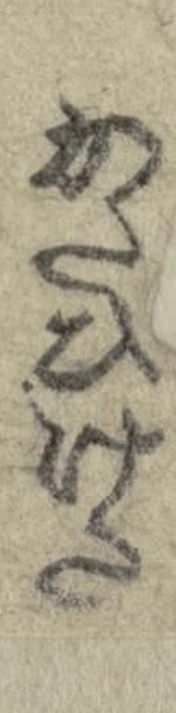かたひげた
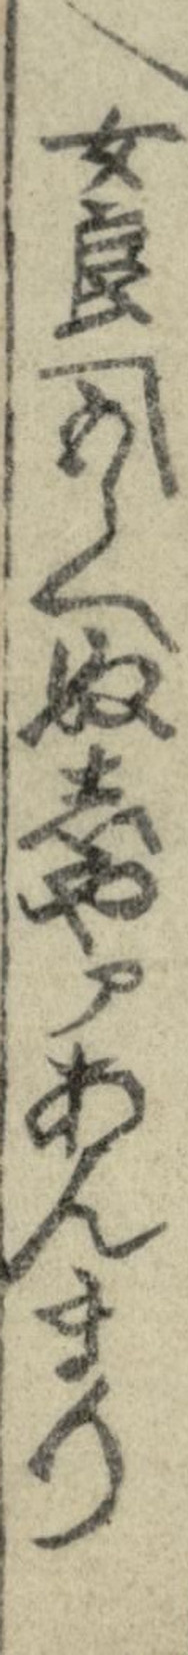女郎〽もし〳〵ぬしやアあんまり
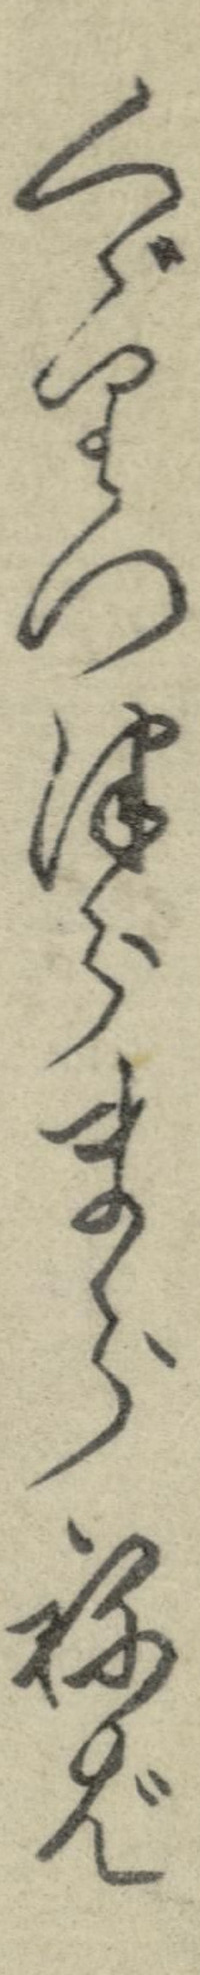くゞりつつらまらねば
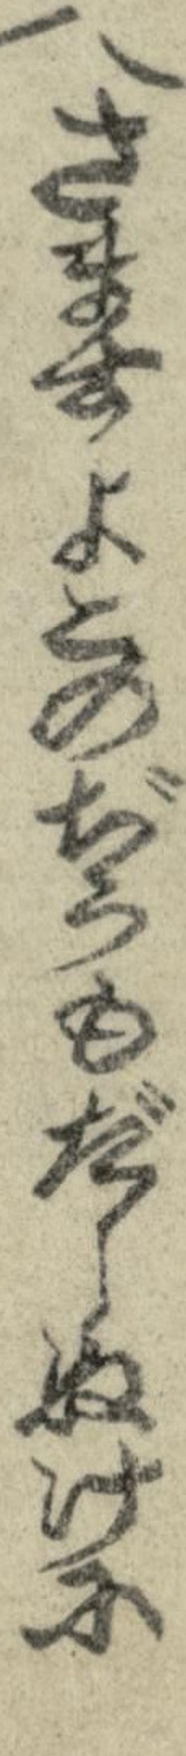さますよこのぢうもだしぬけに
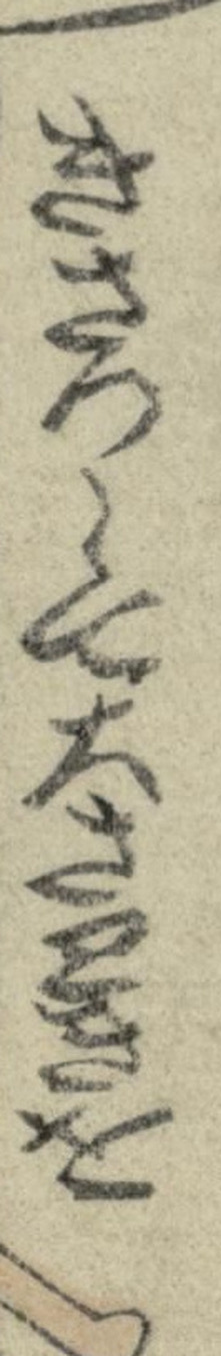きさつして大さわきを
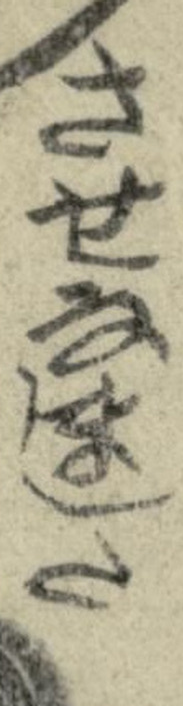させなました
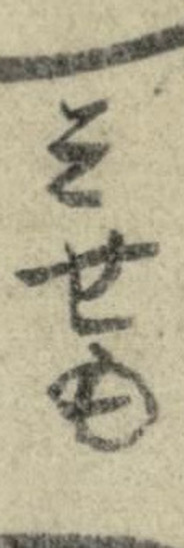みせも
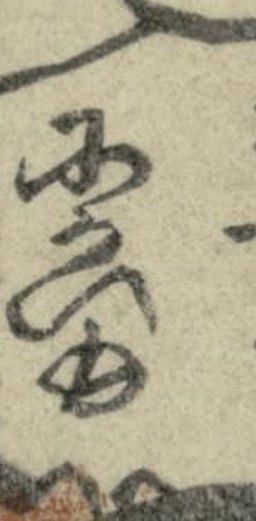にかいも
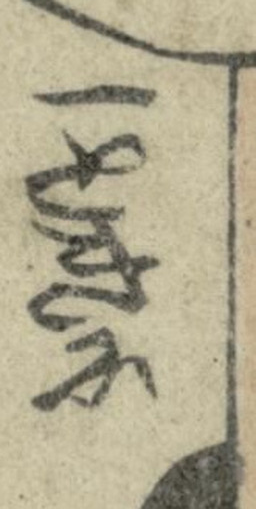一ときに
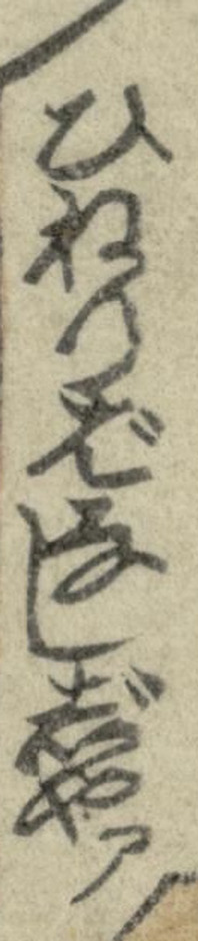ひねりばなしじやア
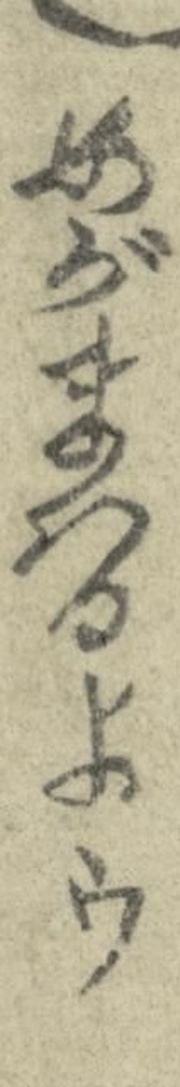めがまはるよウ
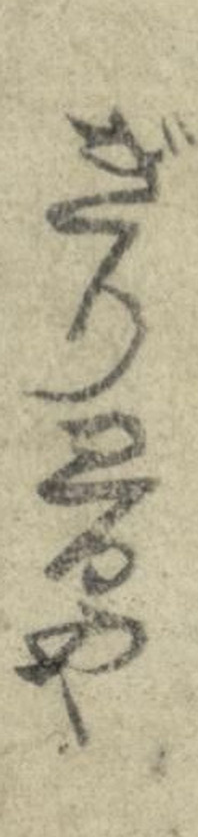ぎりわるや
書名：治る御代　ひやかし鯰
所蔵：東京大学地震研究所図書室 Earthquake Research Institute Library, The University of Tokyo, JAPAN
